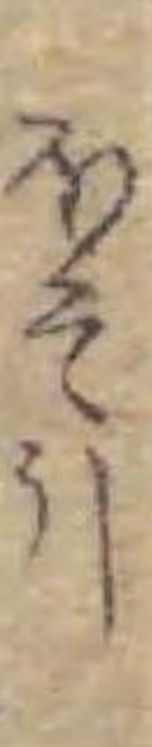ほそ引
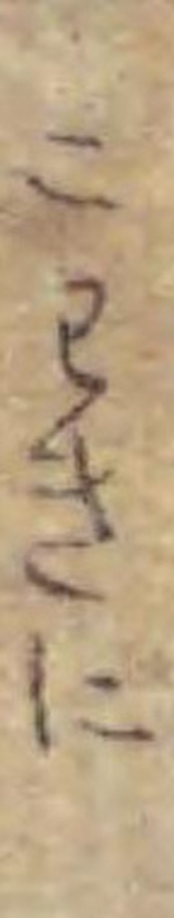こわきに
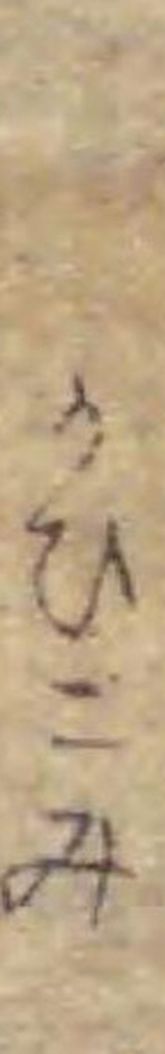かひこみ
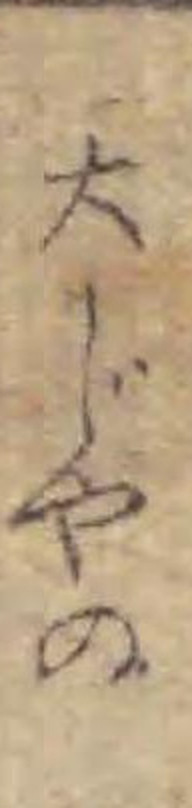大じやの
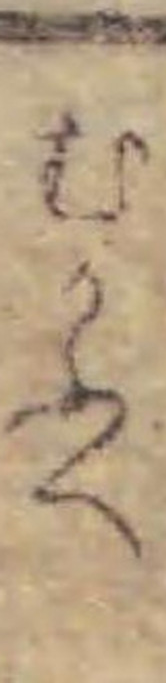むかふへ
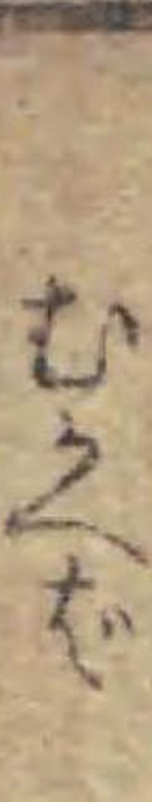むかへば
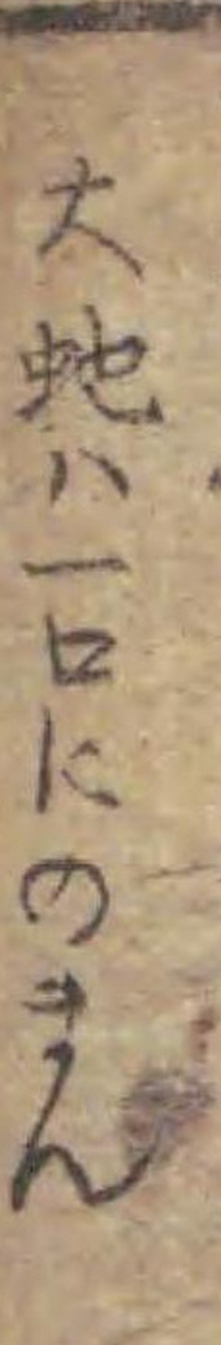大蛇は一口にのまん
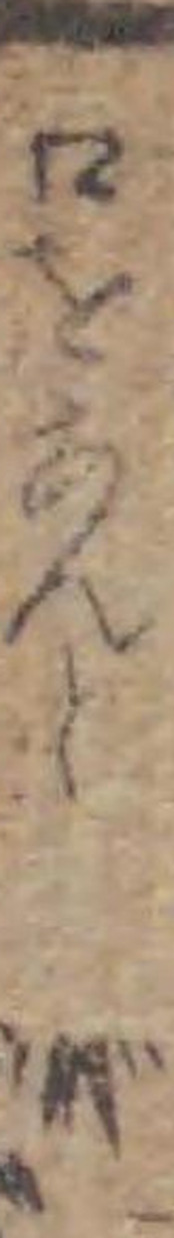口をあんと
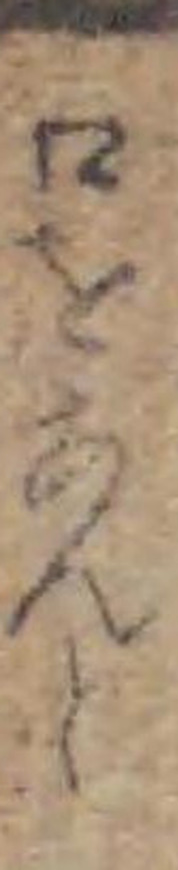口をあんと
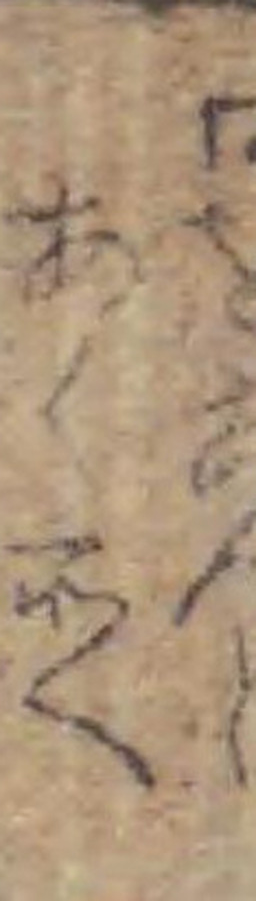あく所へ
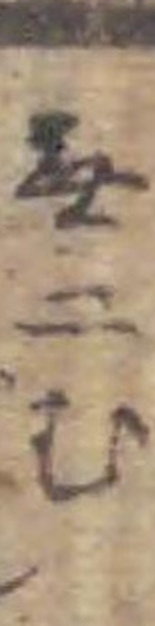無二む
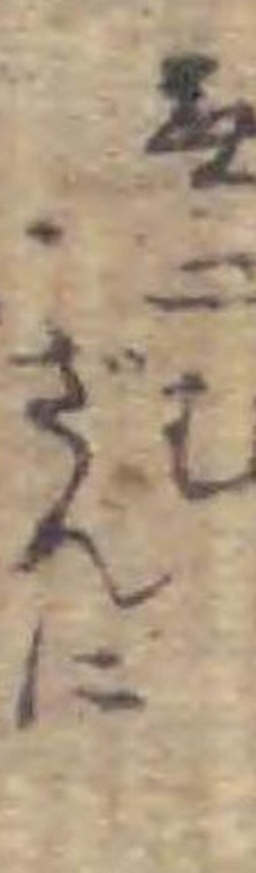ざんに
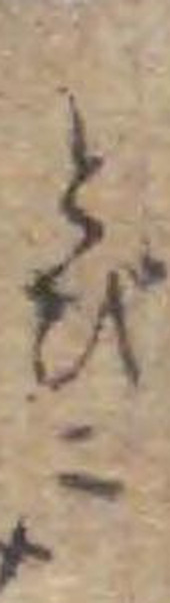とびこ
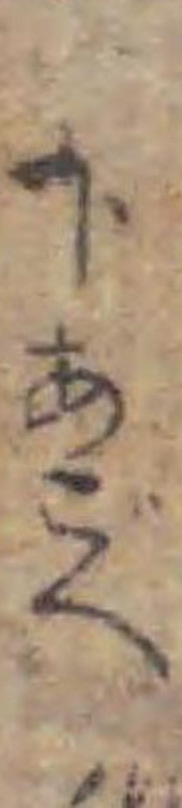下あごへ
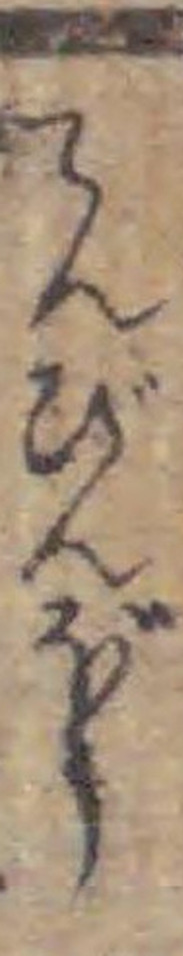てんびんぼう
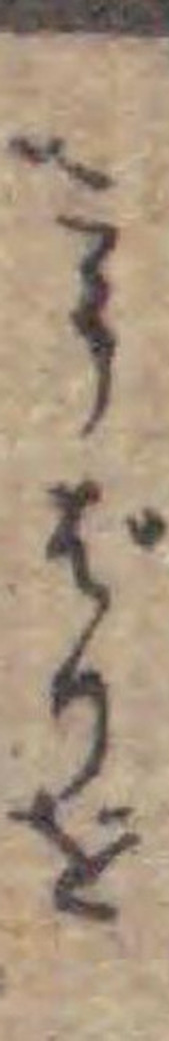こうばりを
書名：虚言八百万八伝 : 3巻
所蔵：国立国会図書館 National Diet Library, JAPAN
